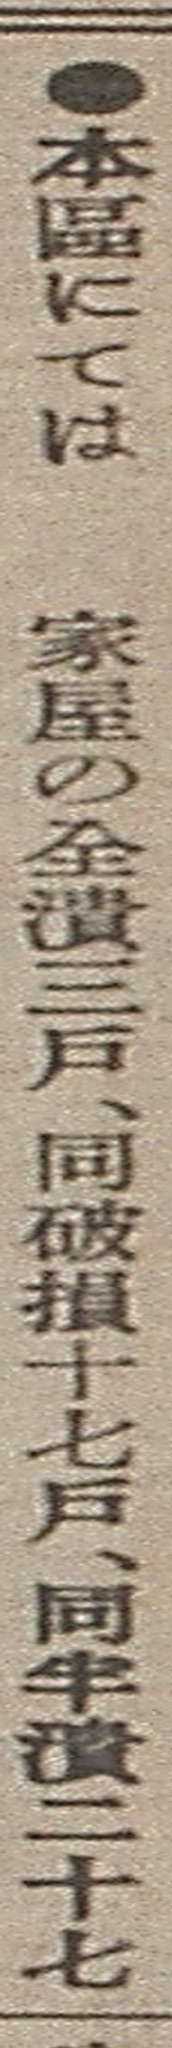●本区にては家屋の全潰三戸、同破損十七戸、同半潰二十七
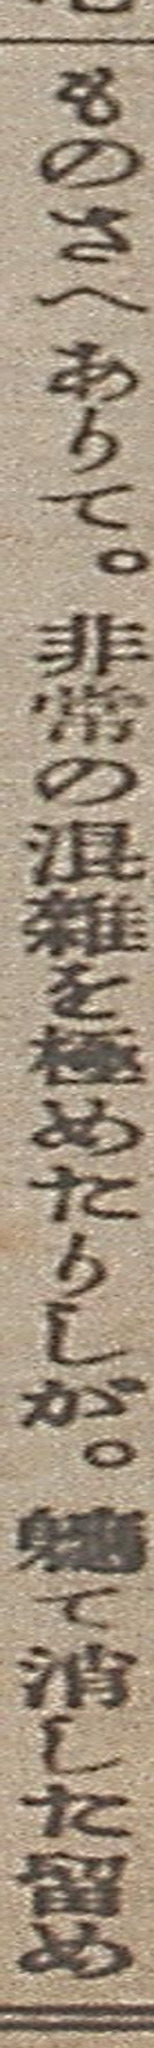ものさへありて。非常の混雑を極めたりしが。軈て消した留め
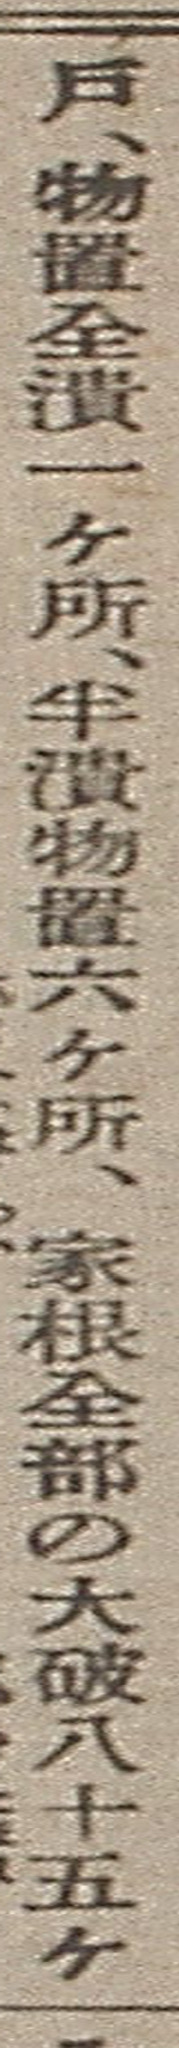戸、物置全潰一ケ所、半潰物置六ケ所、家根全部の大破八十五ケ
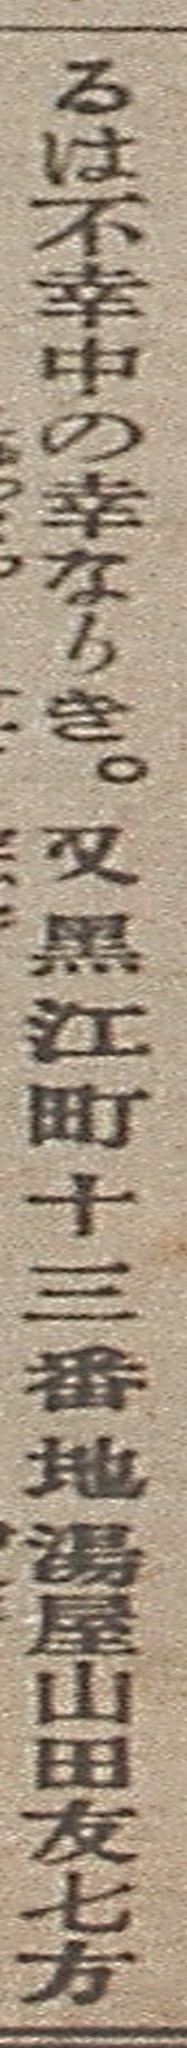るは不幸中の幸なりき。又黒江町十三番地湯屋山田友七方
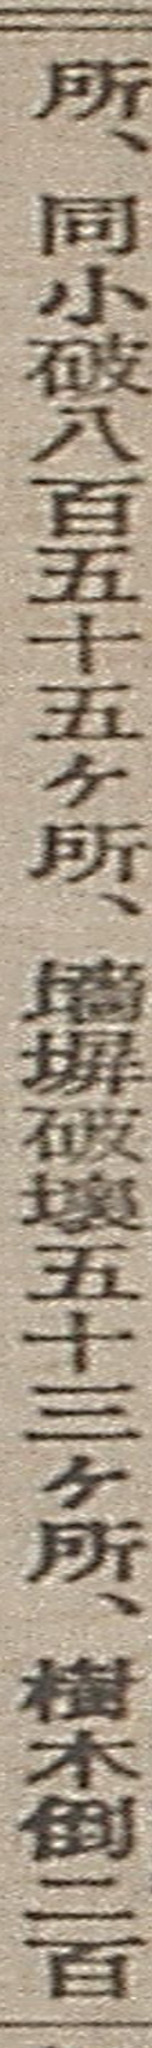所、同小破八百五十五ケ所、墻塀破壊五十三ケ所、樹木倒二百
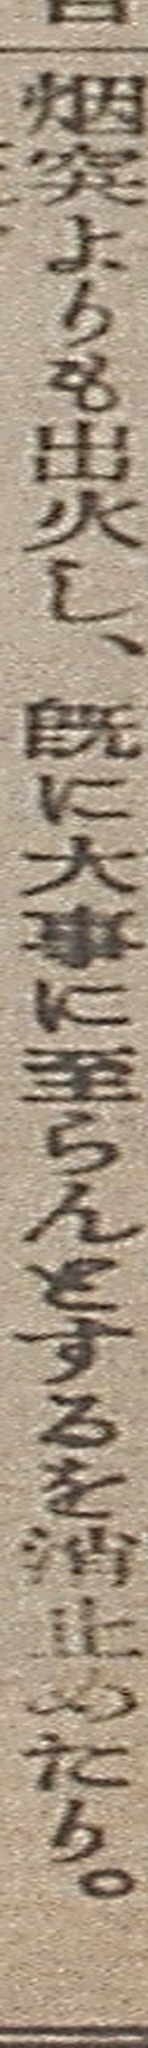烟突よりも出火し、既に大事に至らんとするを消止めたり。
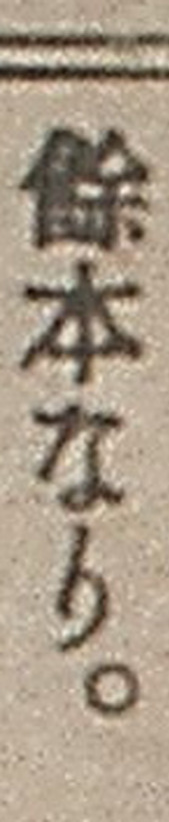余本なり。
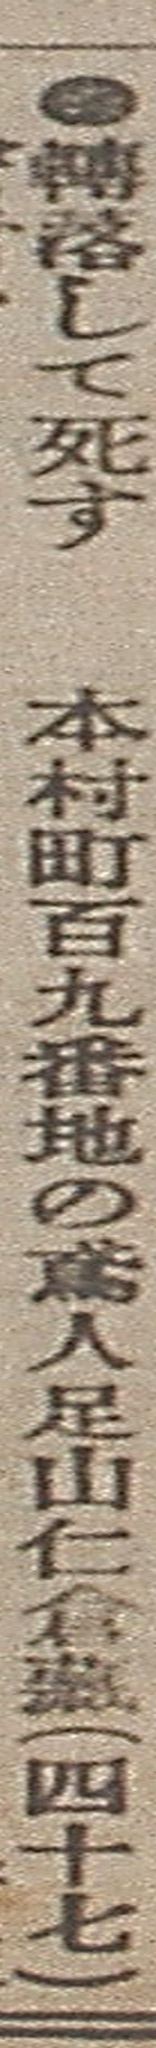●転落して死す本村町百九番地の鳶人足山仁倉蔵
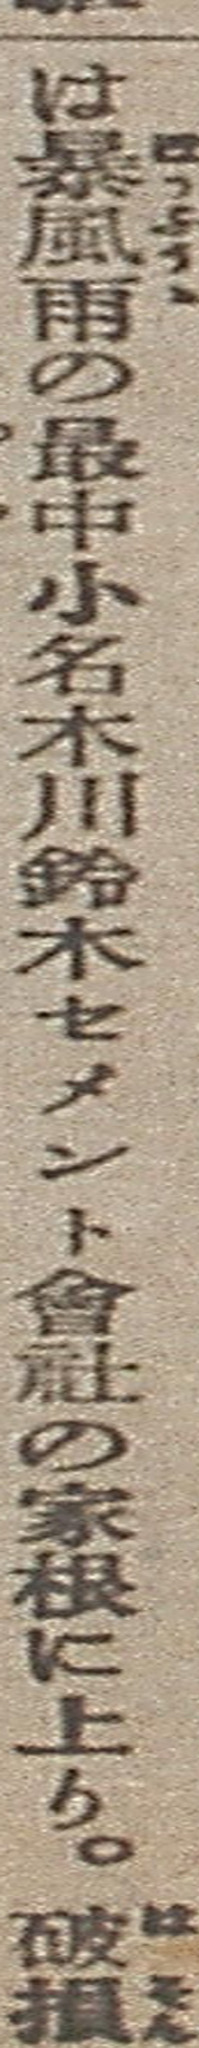は暴風雨の最中小名木川鈴木セメント会社の家根に上り。破損
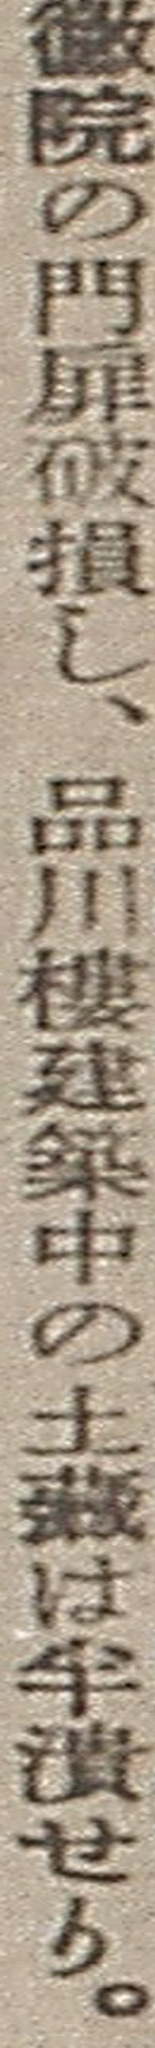黴院の門扉破損し、品川楼建築中の土蔵は半潰せり。
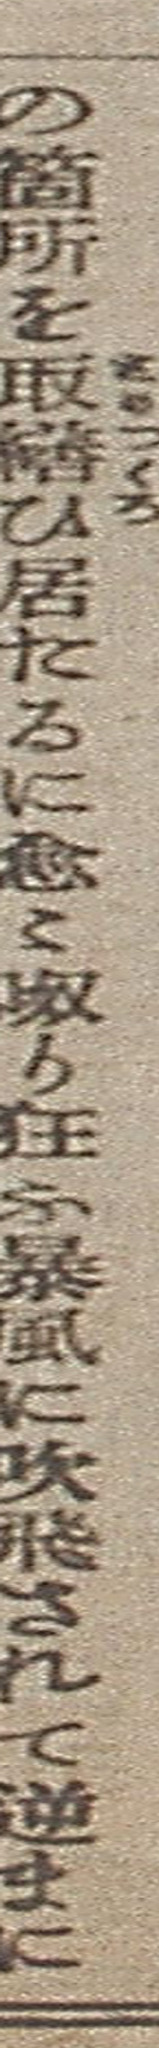の箇所を取繕ひ居たるに愈々嗷り狂ふ暴風に吹飛されて逆まに
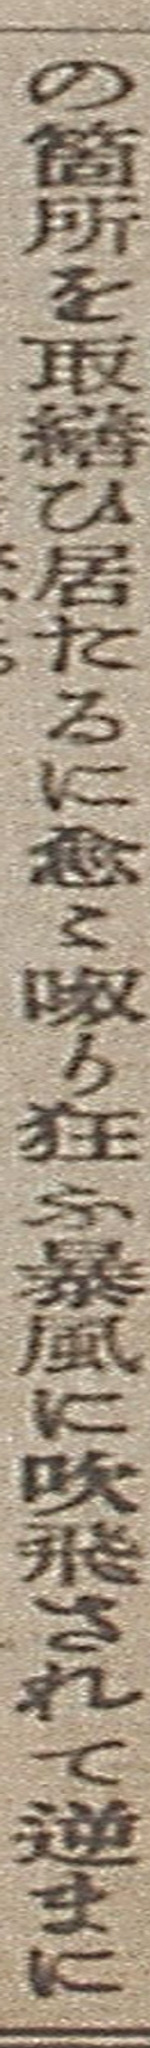の箇所を取繕ひ居たるに愈々嗷り狂ふ暴風に吹飛されて逆まに
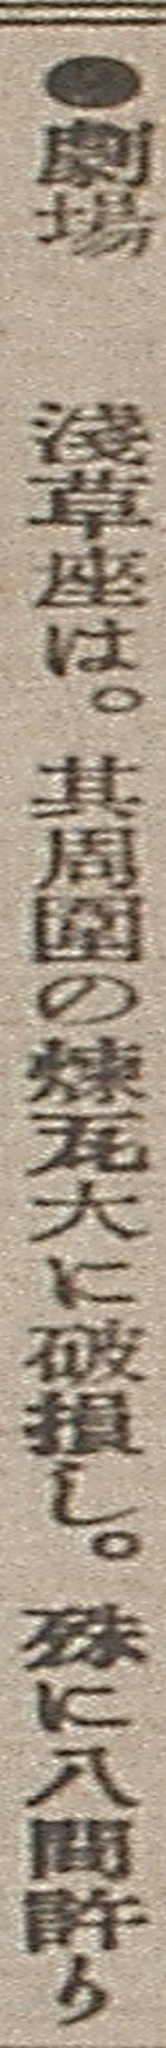●劇場浅草座は。其周囲の煉瓦大に破損し。殊に八間許り
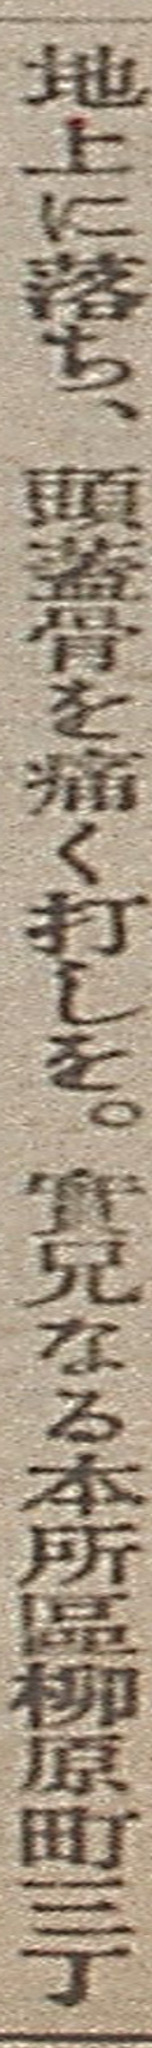地上に落ち、頭蓋骨を痛く打しを。実兄なる本所区柳原町三丁
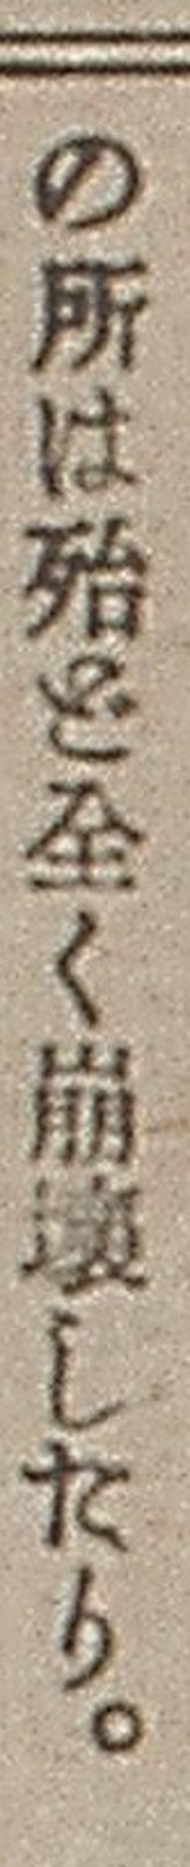の所は殆ど全く崩壊したり。
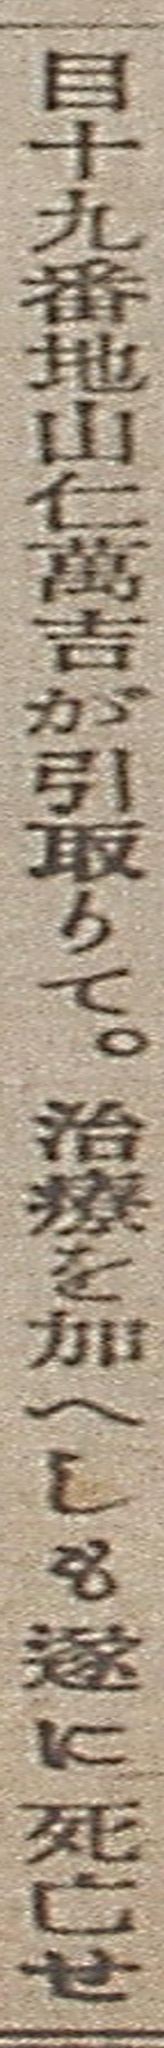目十九番地山仁萬吉が引取りて。治療を加へしも終に死亡せ
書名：風俗畫報臨時増刊第百九十九號　明治三十二年十月各地災害圖會（前編之續）
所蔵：東京大学地震研究所図書室 Earthquake Research Institute Library, The University of Tokyo, JAPAN
